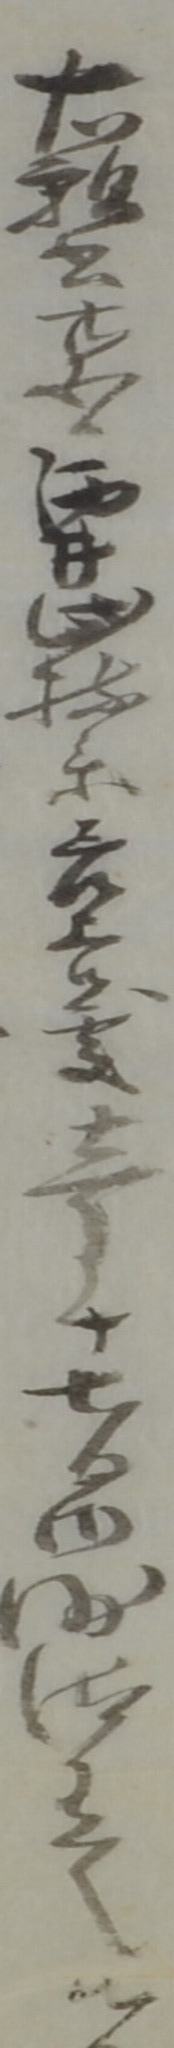右願書廿五日酒井氏持参差上候處十二月十七日御沙汰有之先
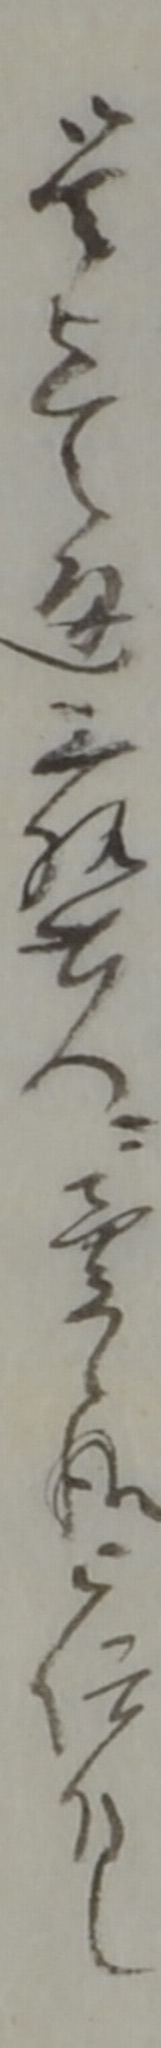是迄之通三拾六人ニ売候様被仰付候
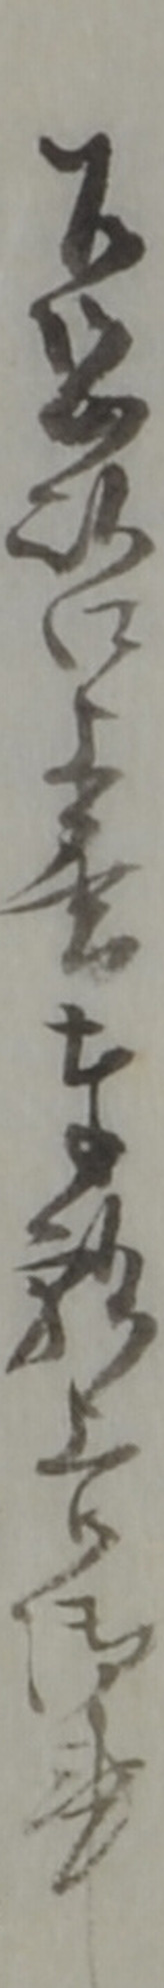乍恐以口上書奉願上候御事
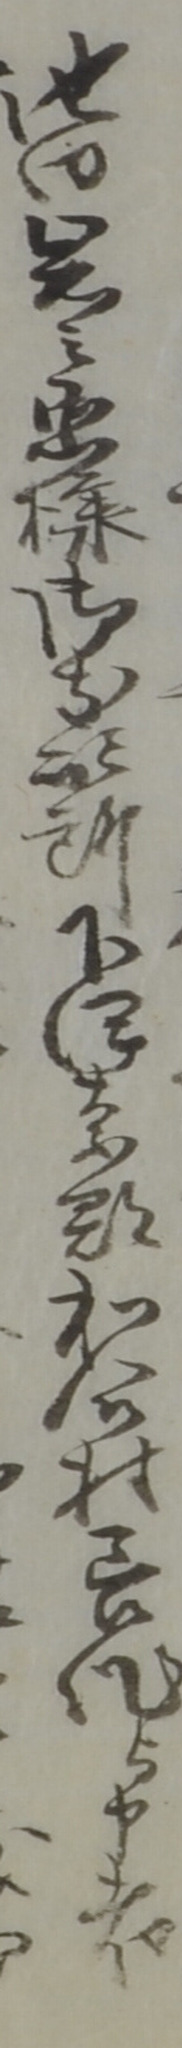池田岩之丞様御支配所下伊奈郡和合村善作と申者
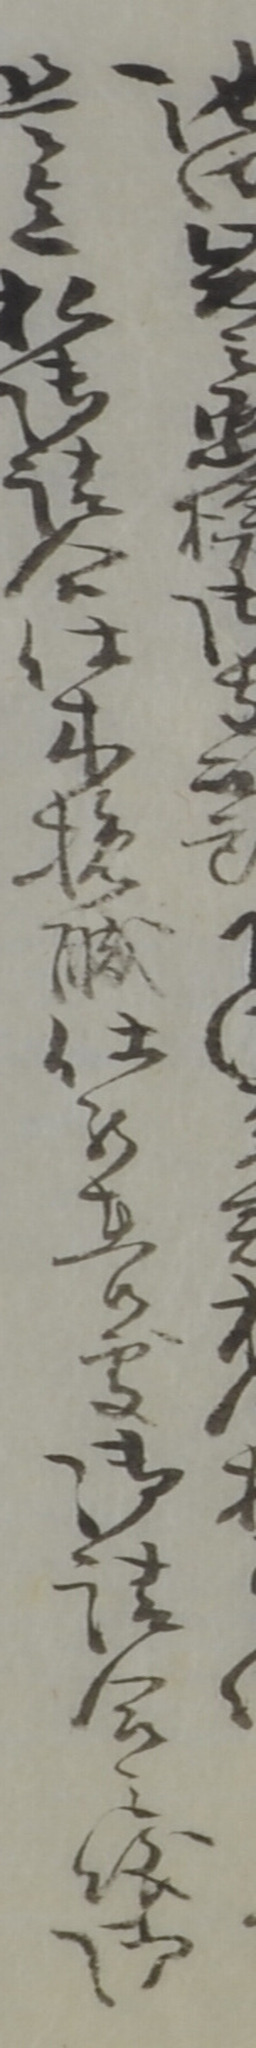是迄私御請合仕木挽職仕罷在候處御請合之儀御
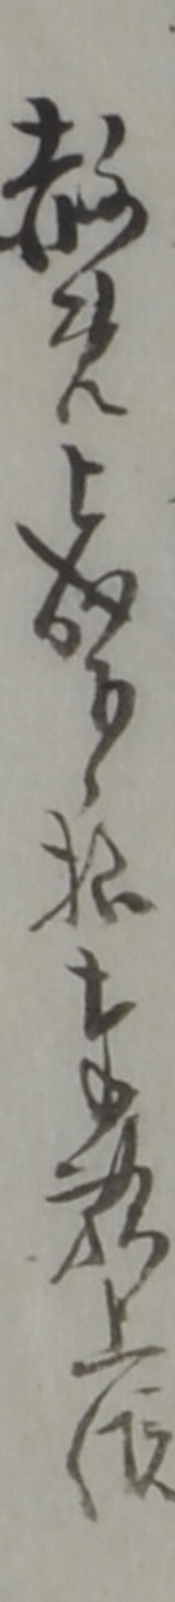赦免被成下候様奉願上候
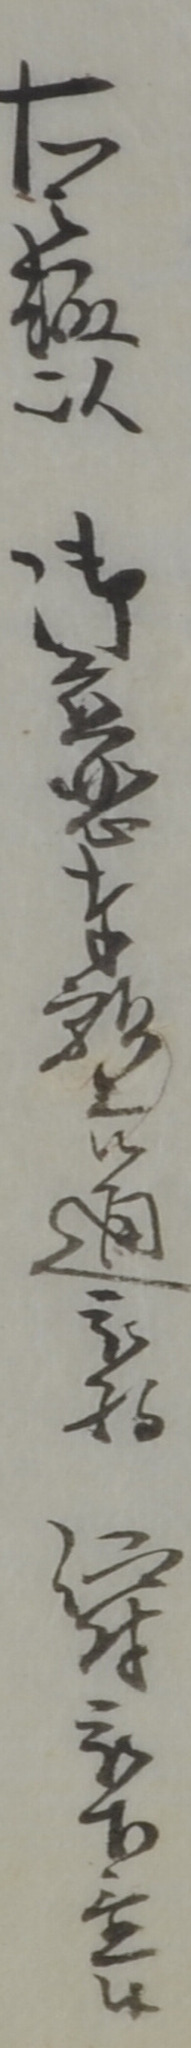右之趣以御慈悲奉願上候通被為仰付被下置候
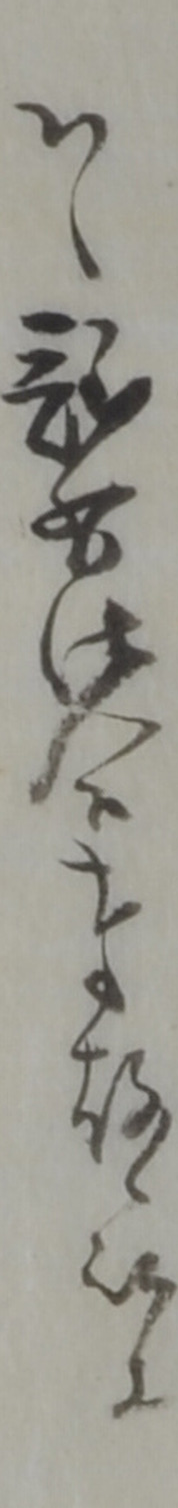ハヽ難有仕合奉存候以上
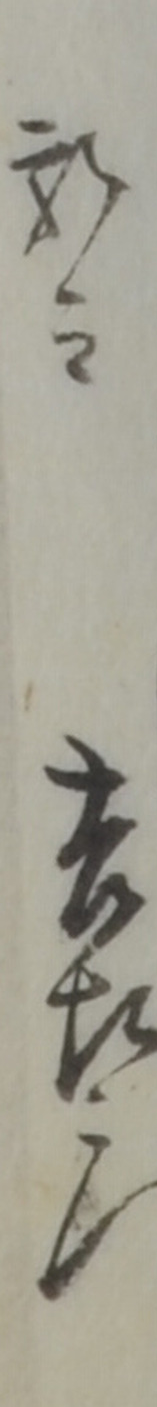願主吉左衛門

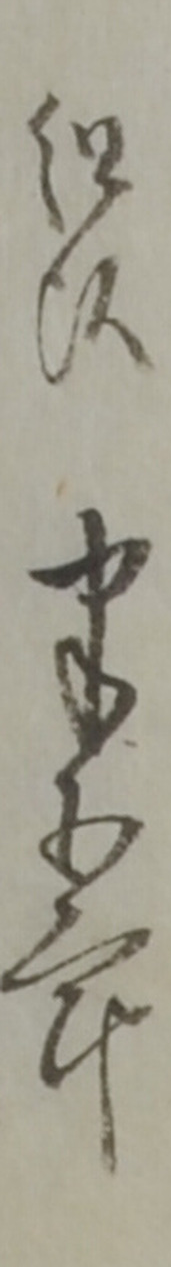組頭半五郎
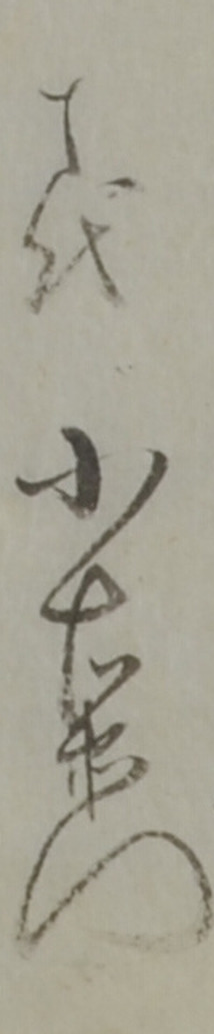丁代小右衛門
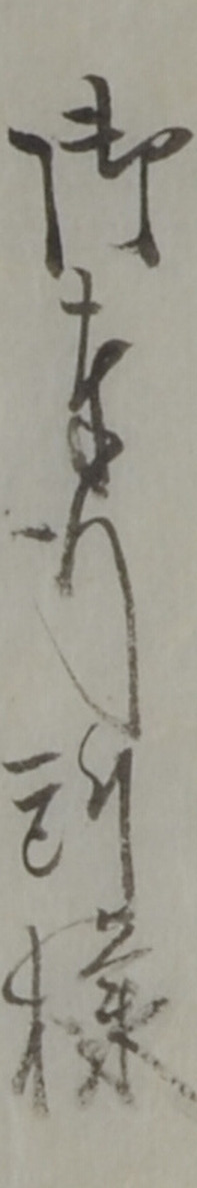御奉行所様
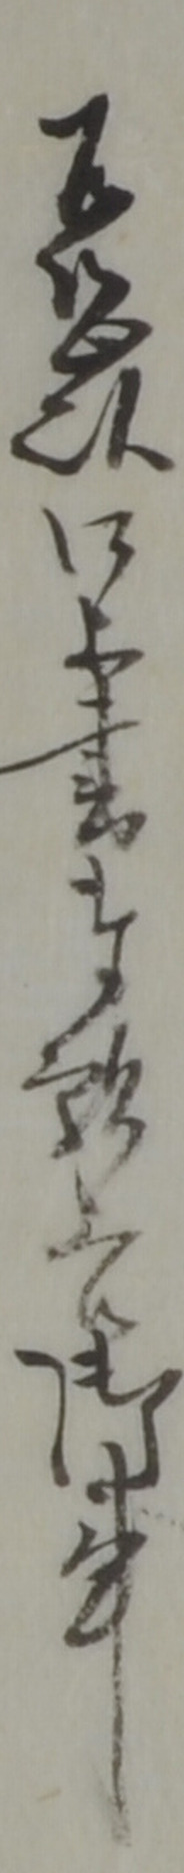乍恐以口上書奉願上候御事
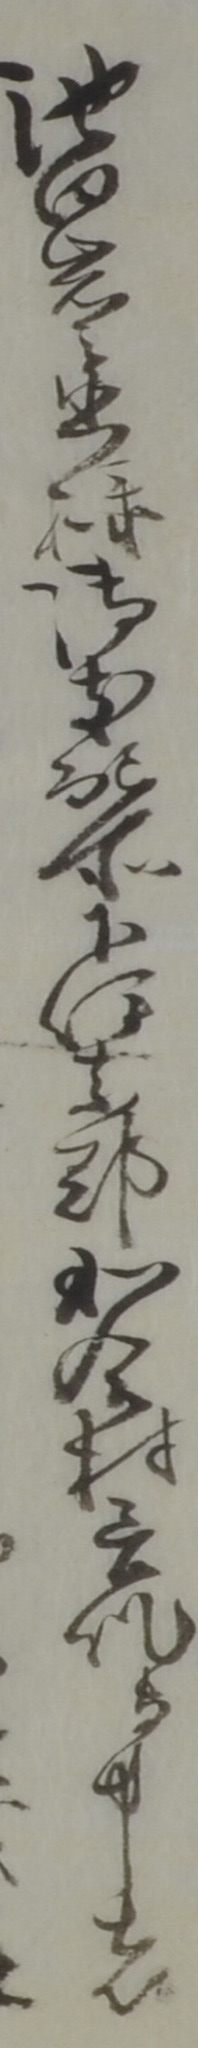池田岩之丞様御支配所下伊奈郡和合村善作と申者
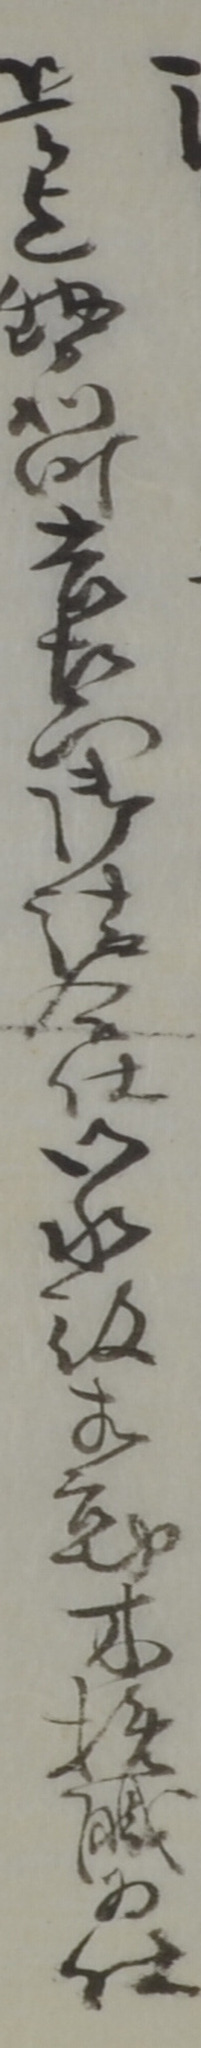是迄勢利町吉左衛門御請合仕御水役相勤木挽職為仕
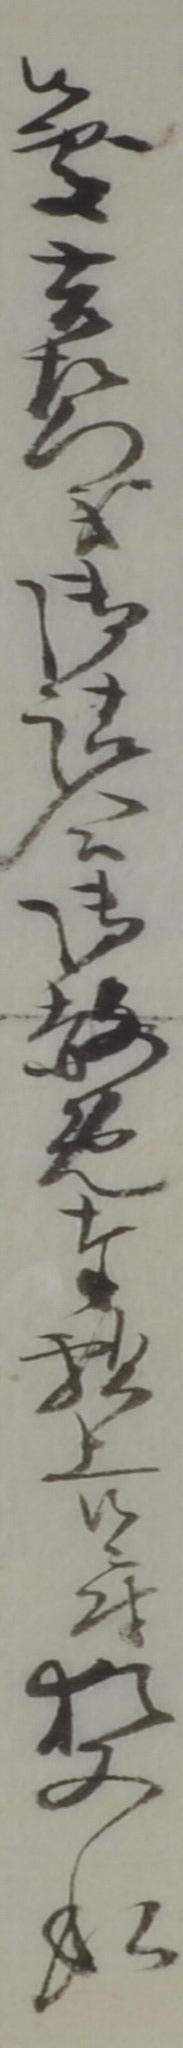候處吉左衛門義御請合御赦免奉願上候ニ付猶又私
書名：諸願書控簿
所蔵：伊那市立高遠町図書館・合同会社AMANE
